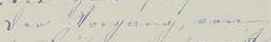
Der Vorgang, von
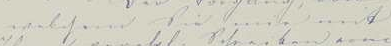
welchem Sie mir mit
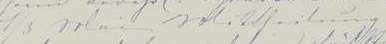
1/3 Mai Mittheilung
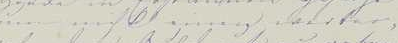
um nicht einen weiter-
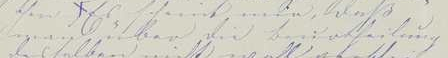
man «über die Beurtheilung
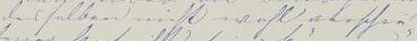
desselben nicht wohl verschie-
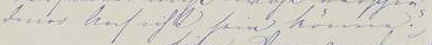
dener Ansicht sein könne.»
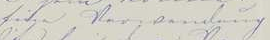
Eine Verwendung
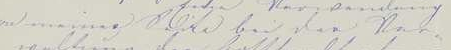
von meiner Seite bei der Ver-
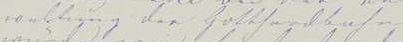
waltung der Gotthardbahn
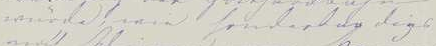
würde, wie sonderbar dies
